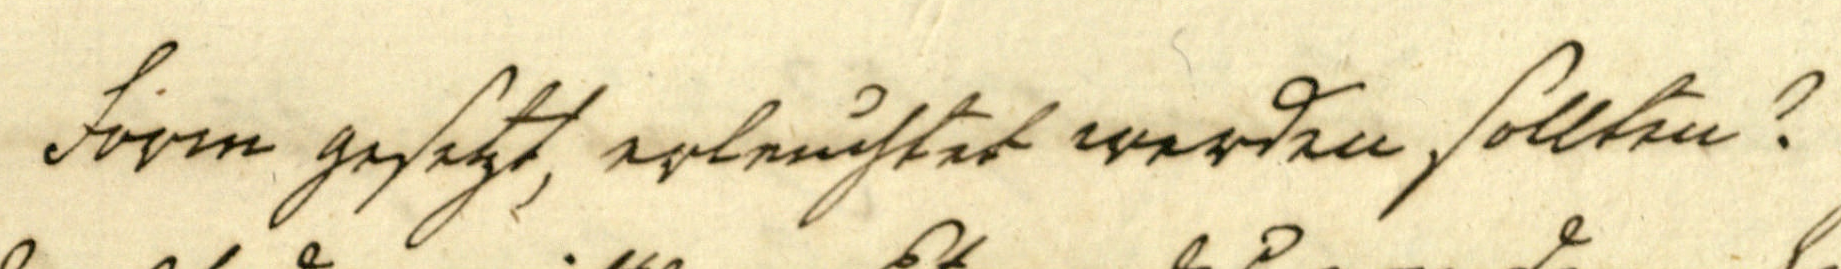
Form gesetzt, erleuchtet werden sollten?
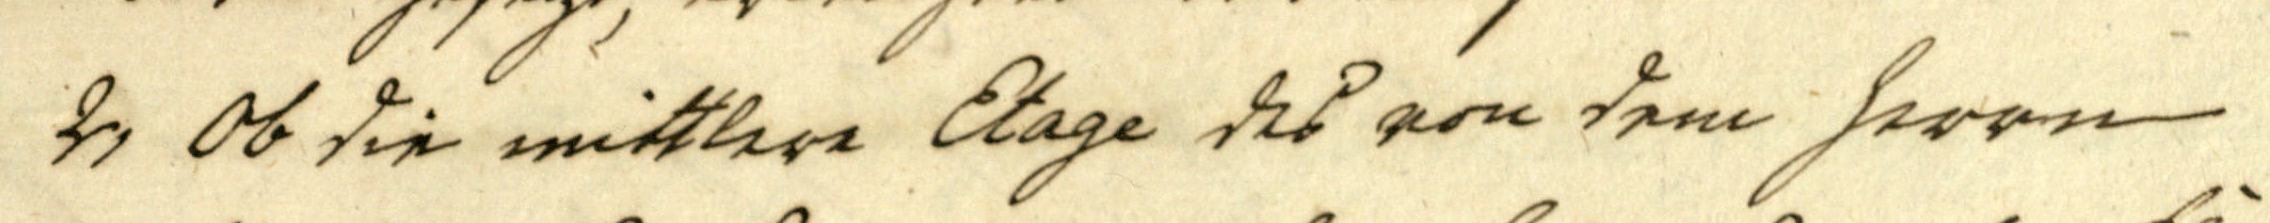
2., Ob die mittlere Etage des von dem Herrn
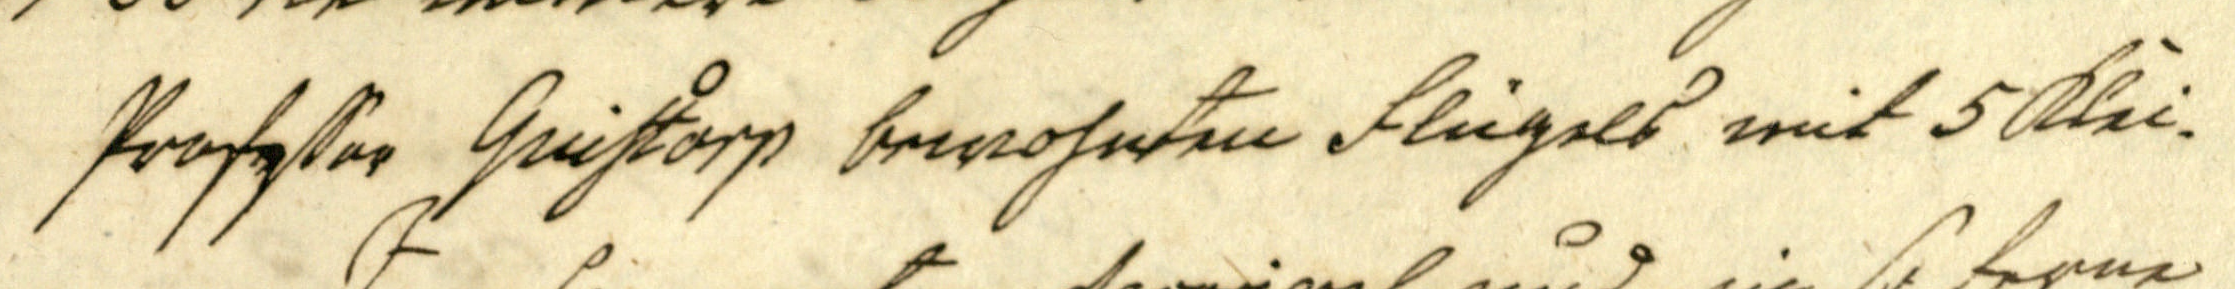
Professor Quistorp bewohnten Flügels mit 5 klei¬
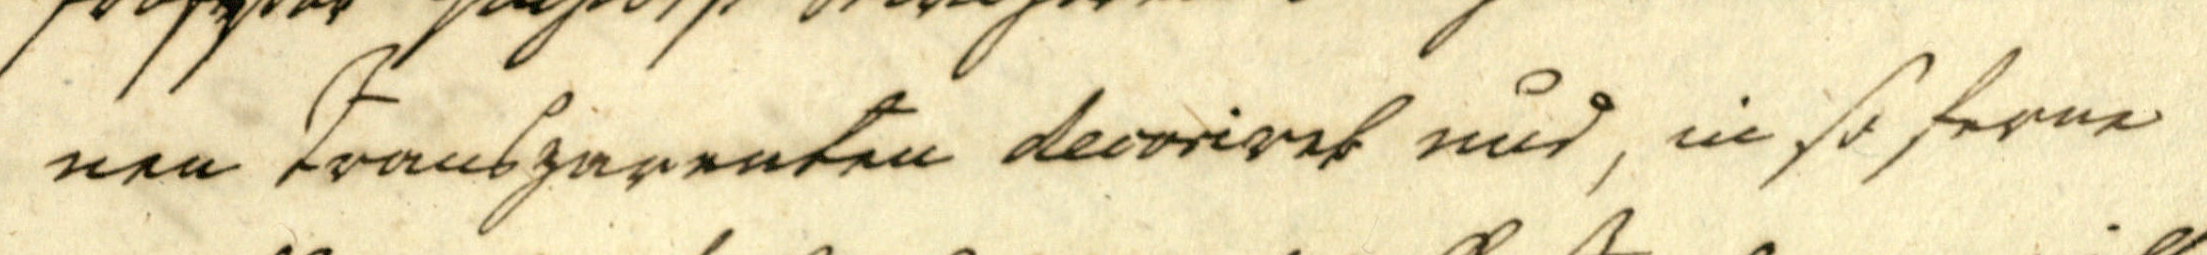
nen Transparenten decoriret und, in so ferne
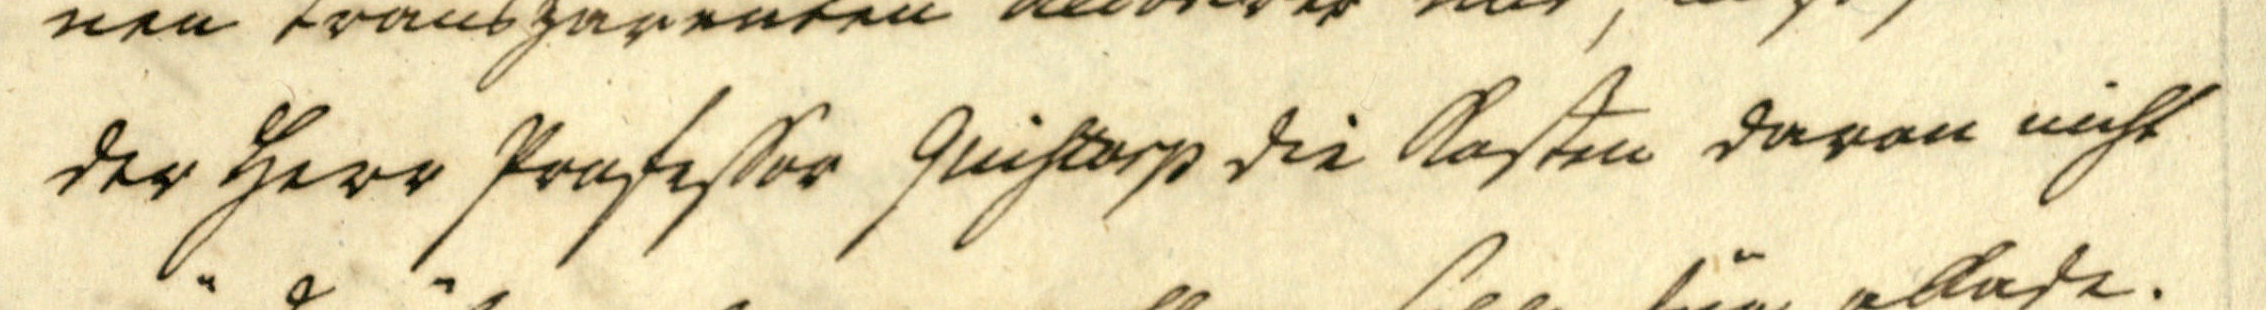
der Herr Professor Quistorp die Kosten davon nicht
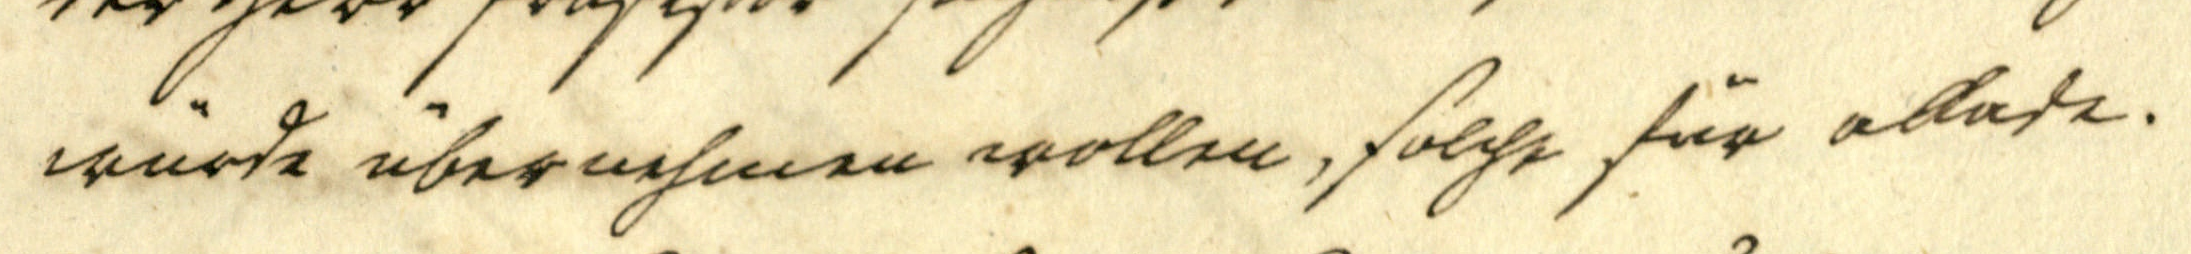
würde über nehmen wollen, solche für akade¬
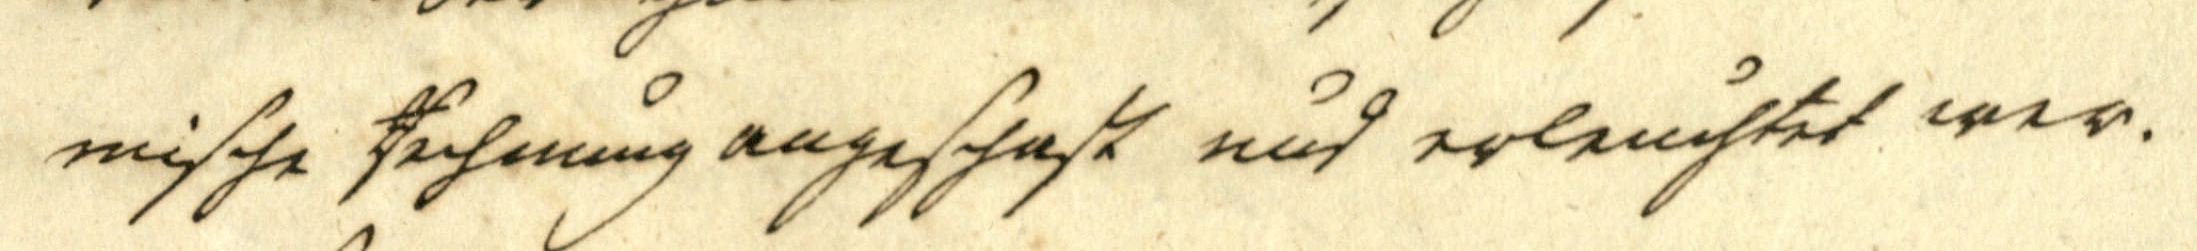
mische Rechnung angeschaft und erleuchtet wer¬
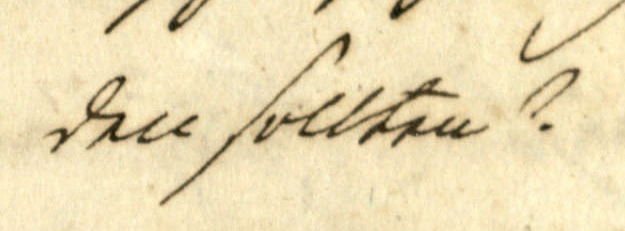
de sollten?
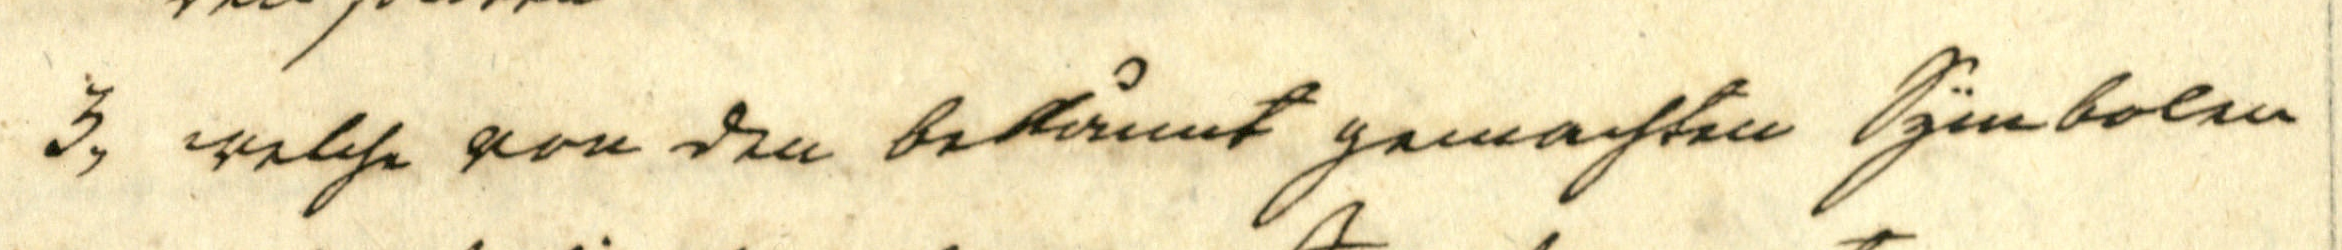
3., welche von den bekannt gemachten Sÿmbolen
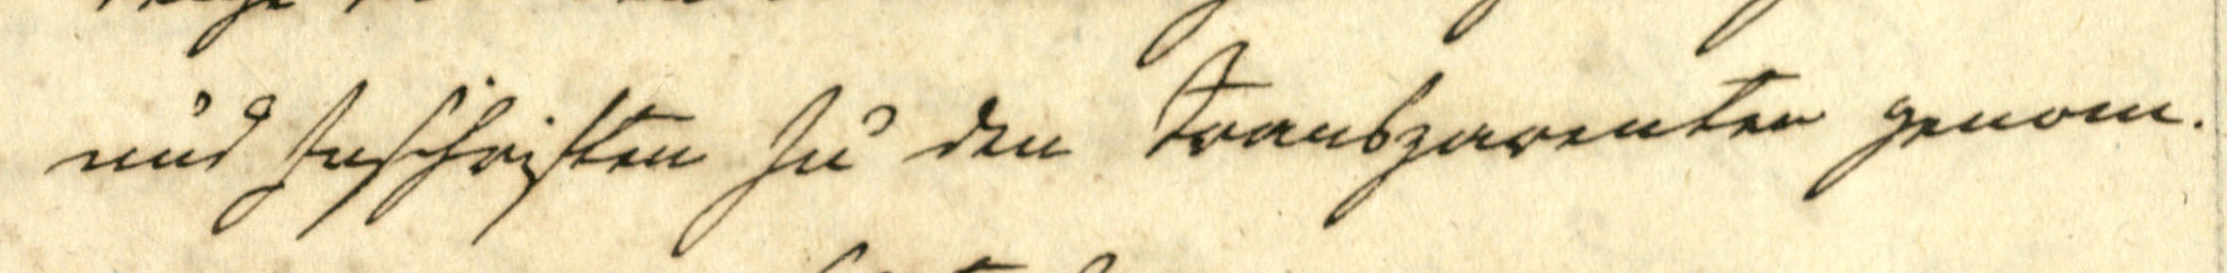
und Inschriften zu den Transparenten genom¬
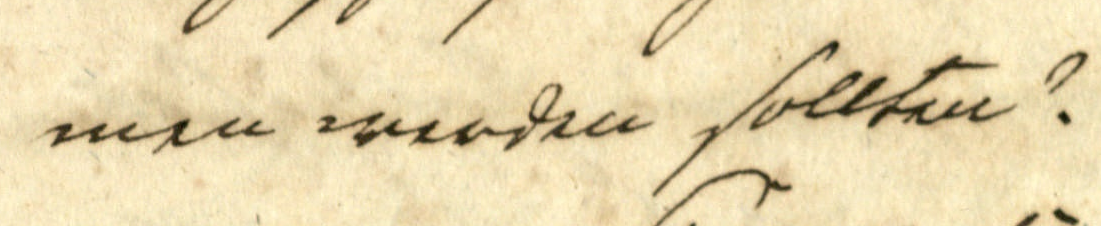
men werden sollten?
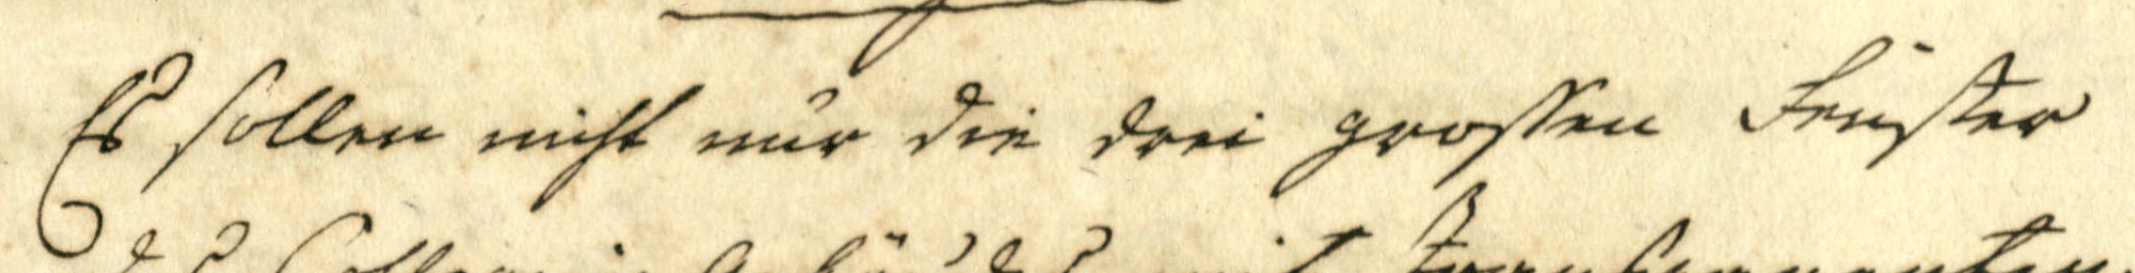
Es sollen nicht nur die drei grossen Fenster
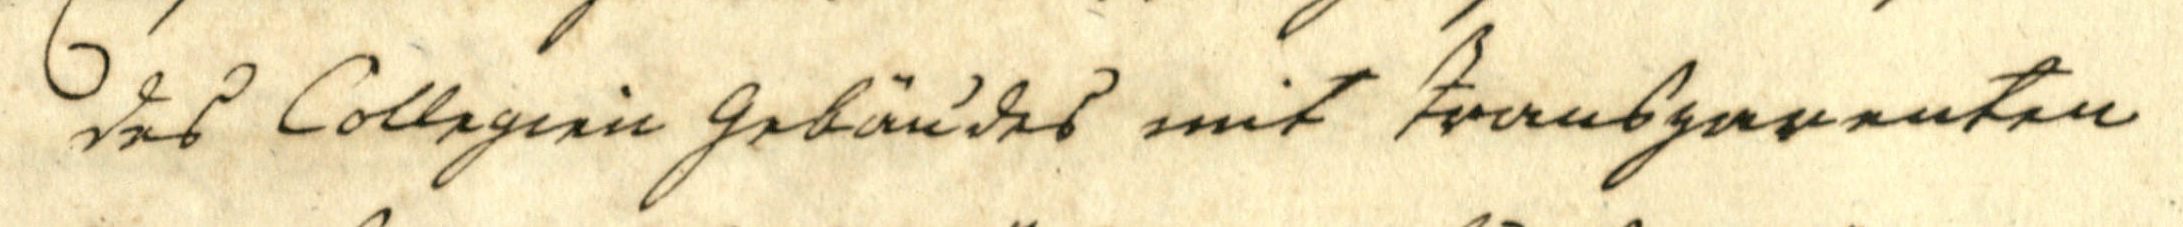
des Collegien Gebäudes mit Transparenten
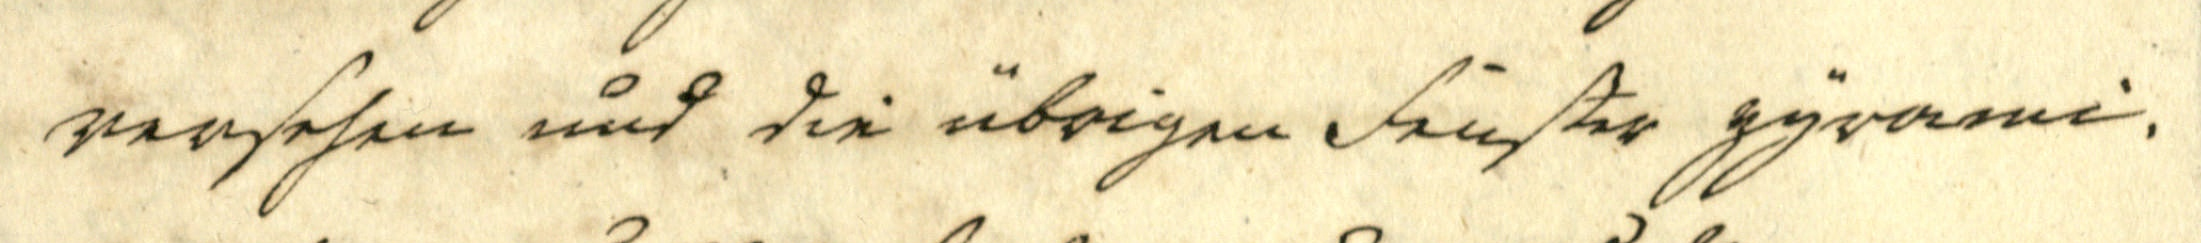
versehen und die übrigen Fenster pÿrami¬
